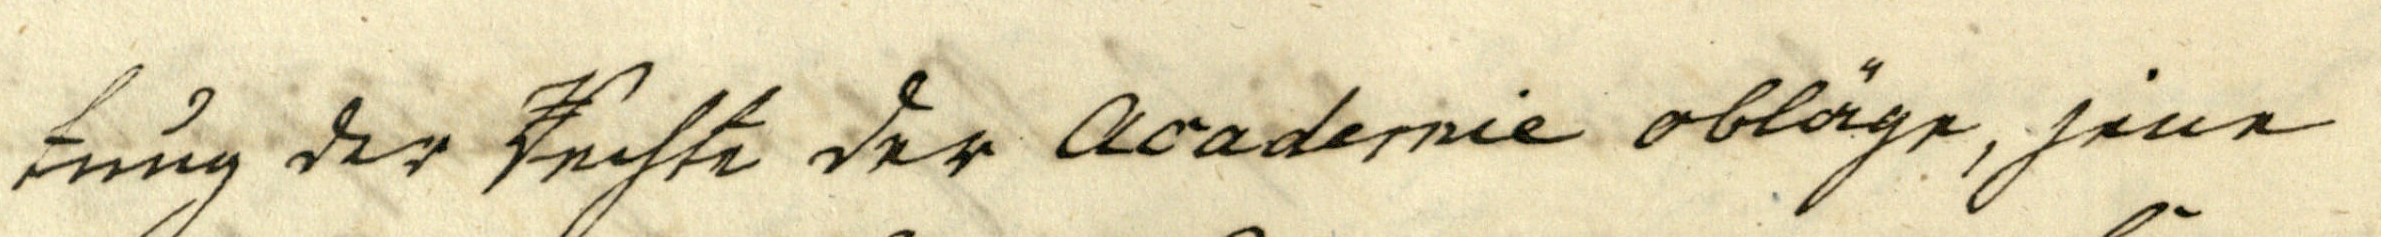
tung der Rechte der Academie obläge, jene
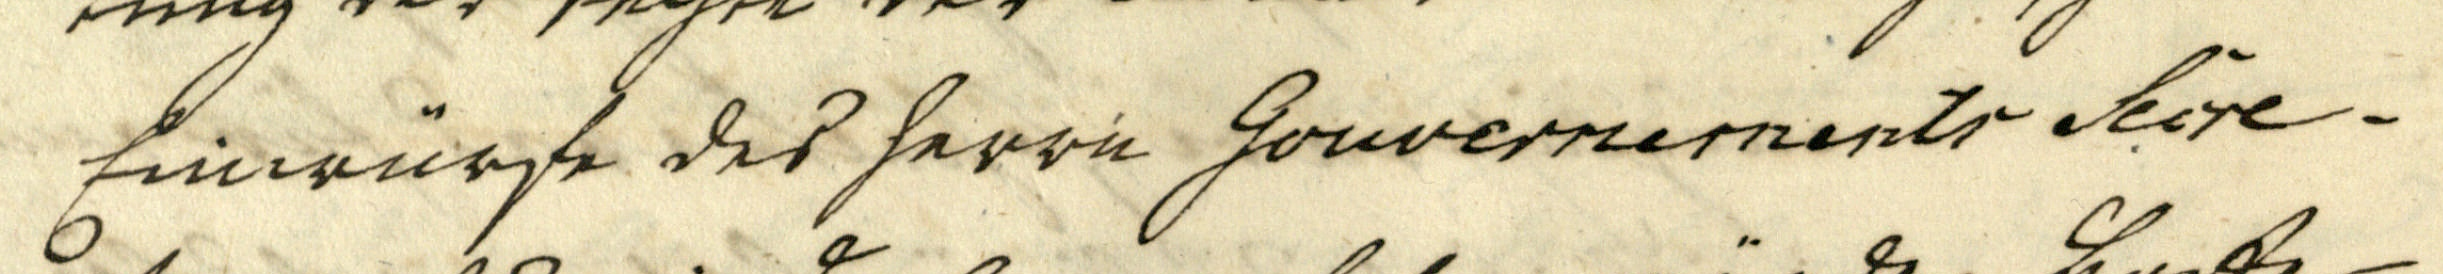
Einwürfe des Herrn Gouvernements Secre¬
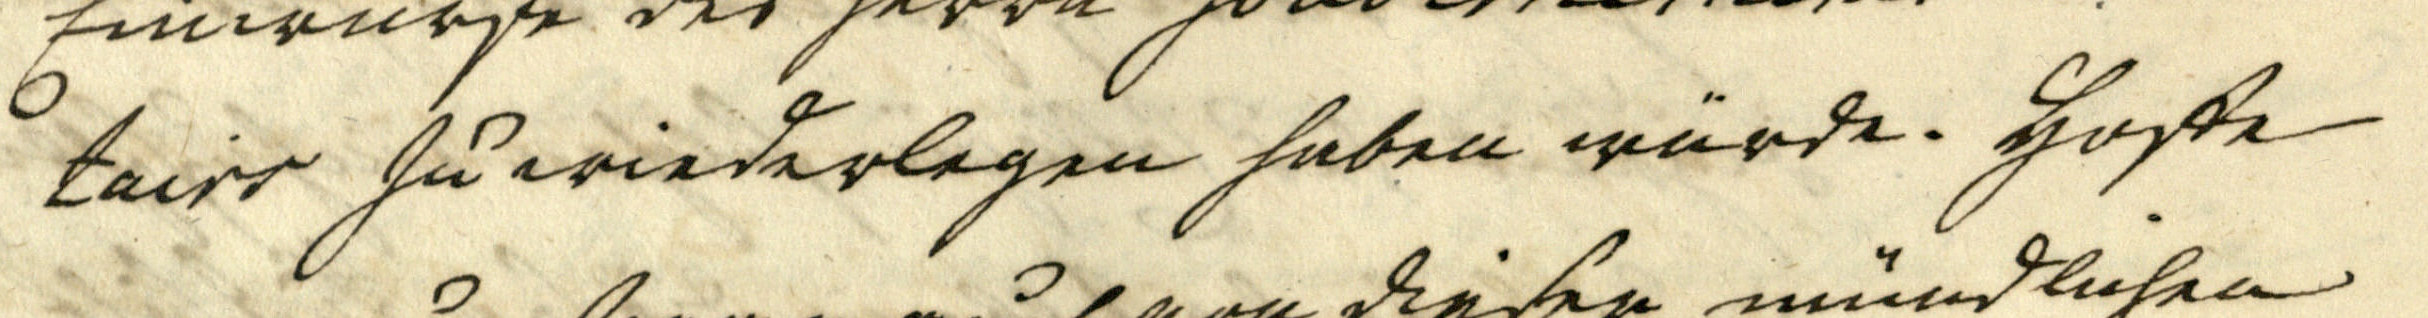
tairs zu wiederlegen haben würde. Hoffe
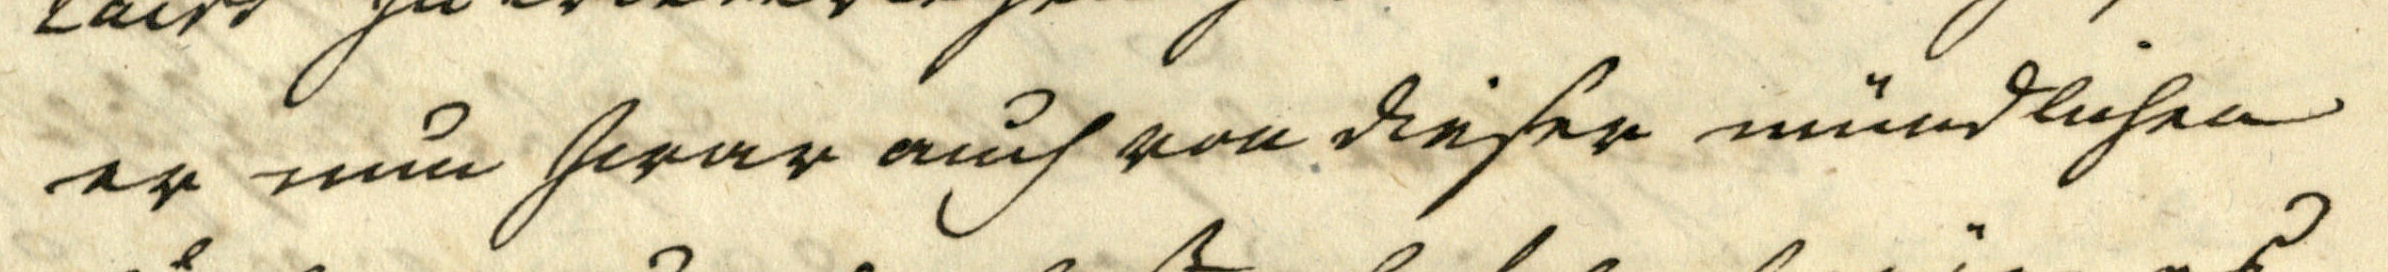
er nun zwar auch von dieser mündlichen
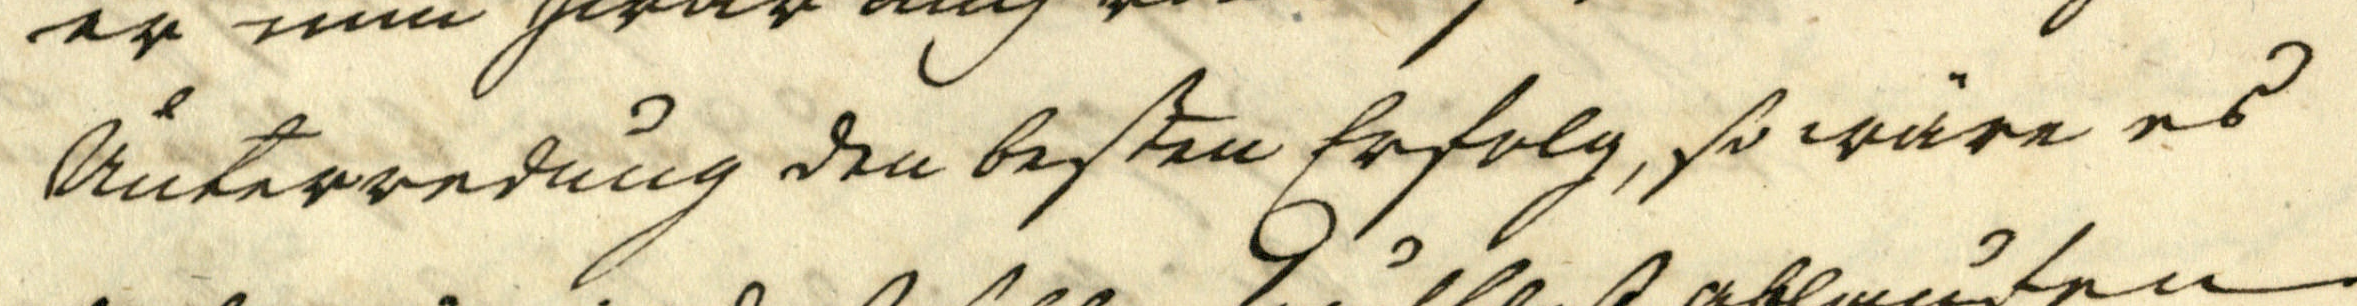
Unterredung den besten Erfolg, so wäre es
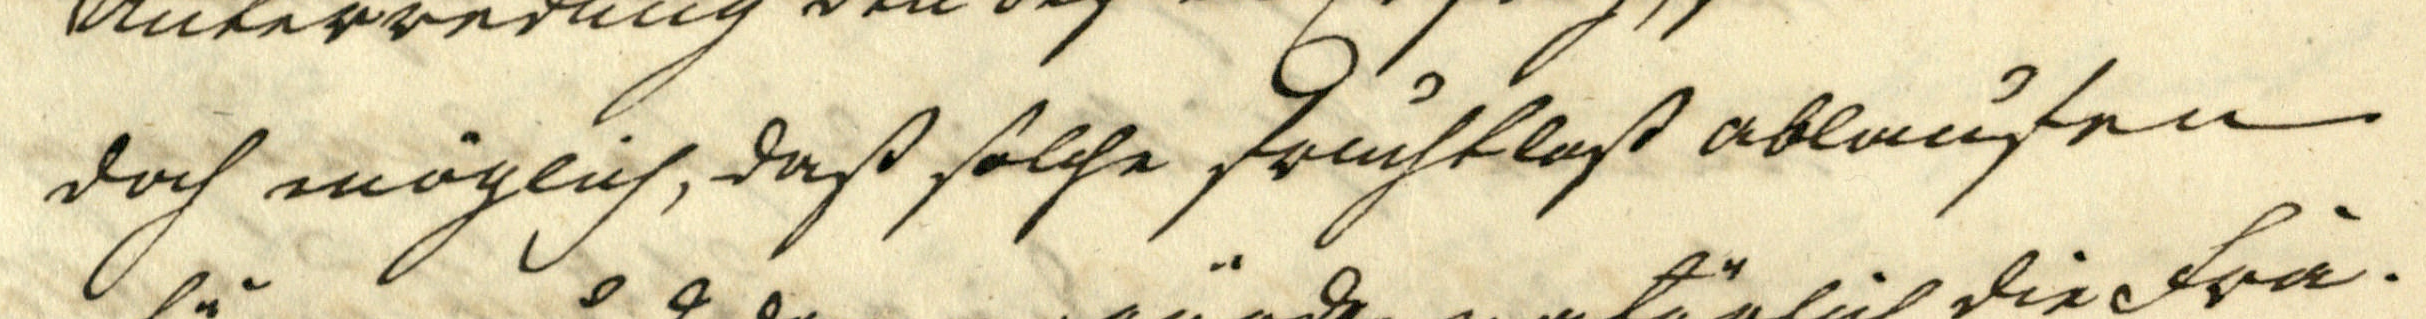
doch möglich, daß solche fruchtloß ablaufen
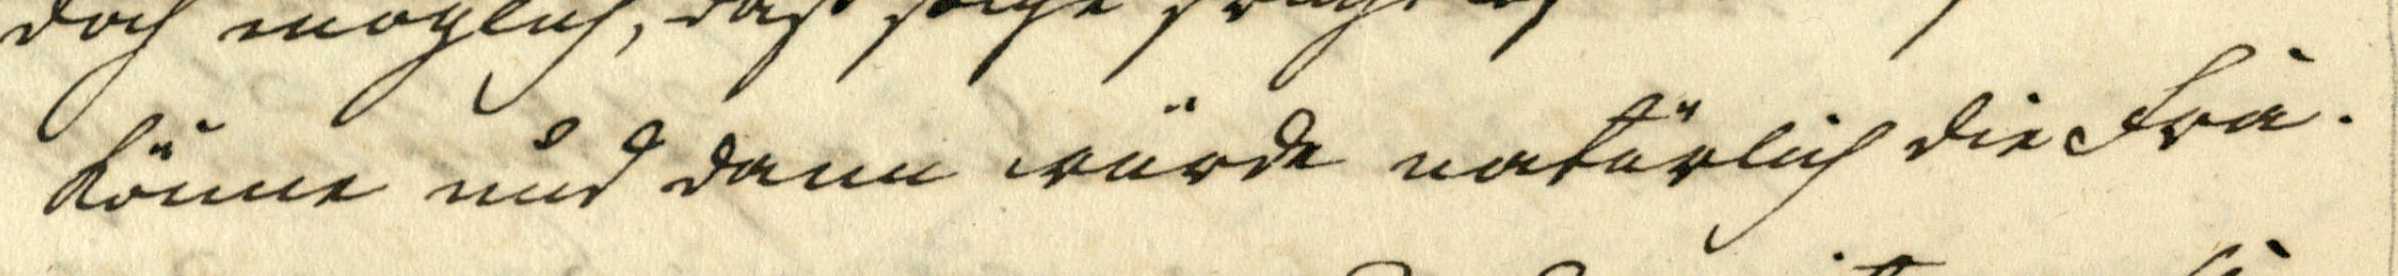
könne und dann würde natürlich die Fra¬
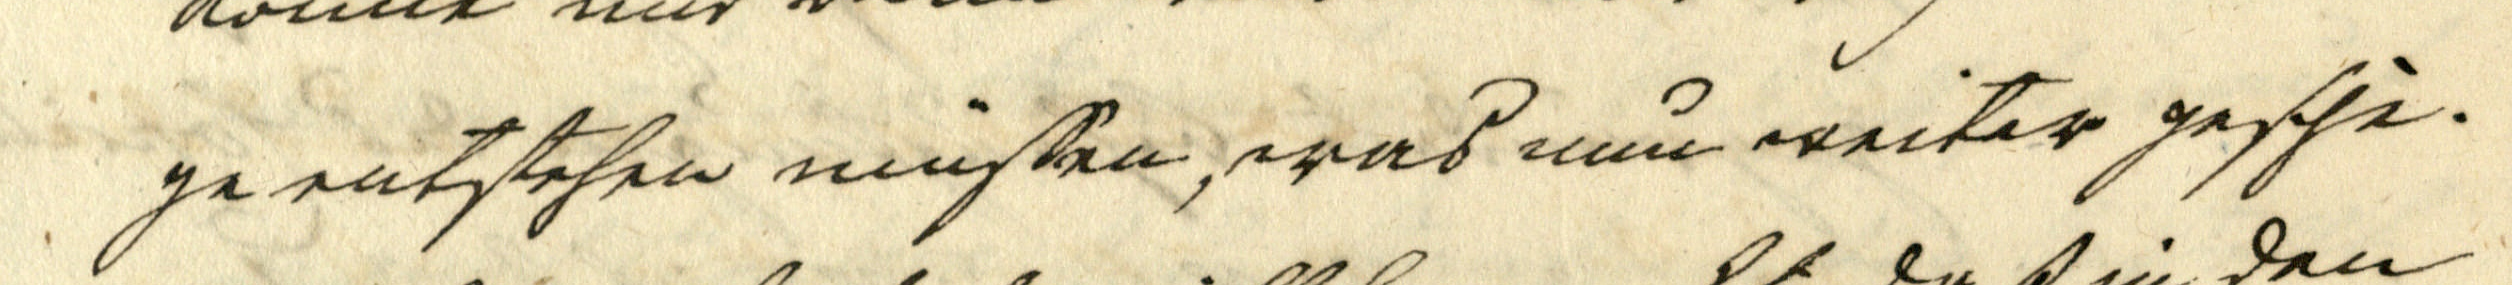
ge entstehen müssen, was nun weiter gesche¬
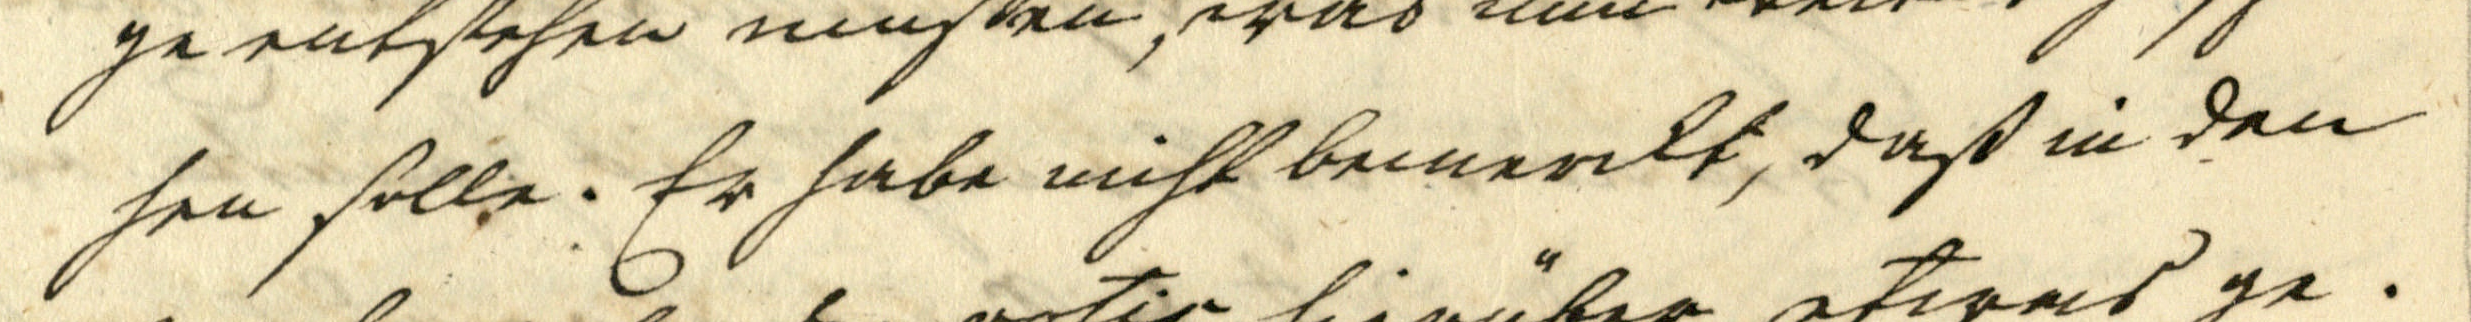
hen solle. Er habe nicht bemerckt, daß in den
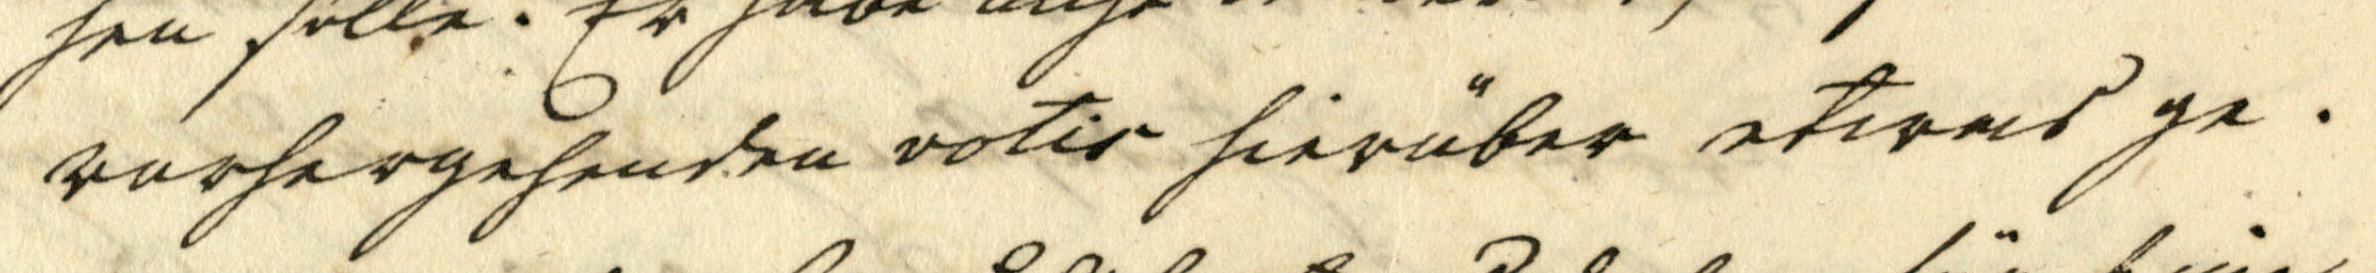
vorhergehenden votis hierüber etwas ge¬
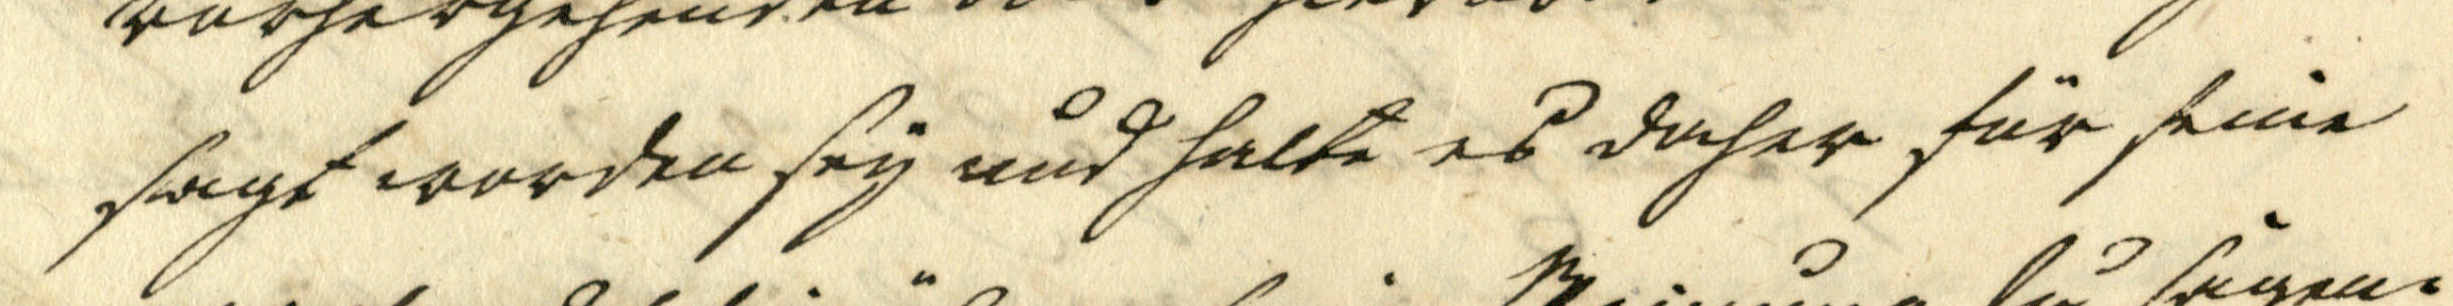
sagt worden seÿ und halte es daher für seine
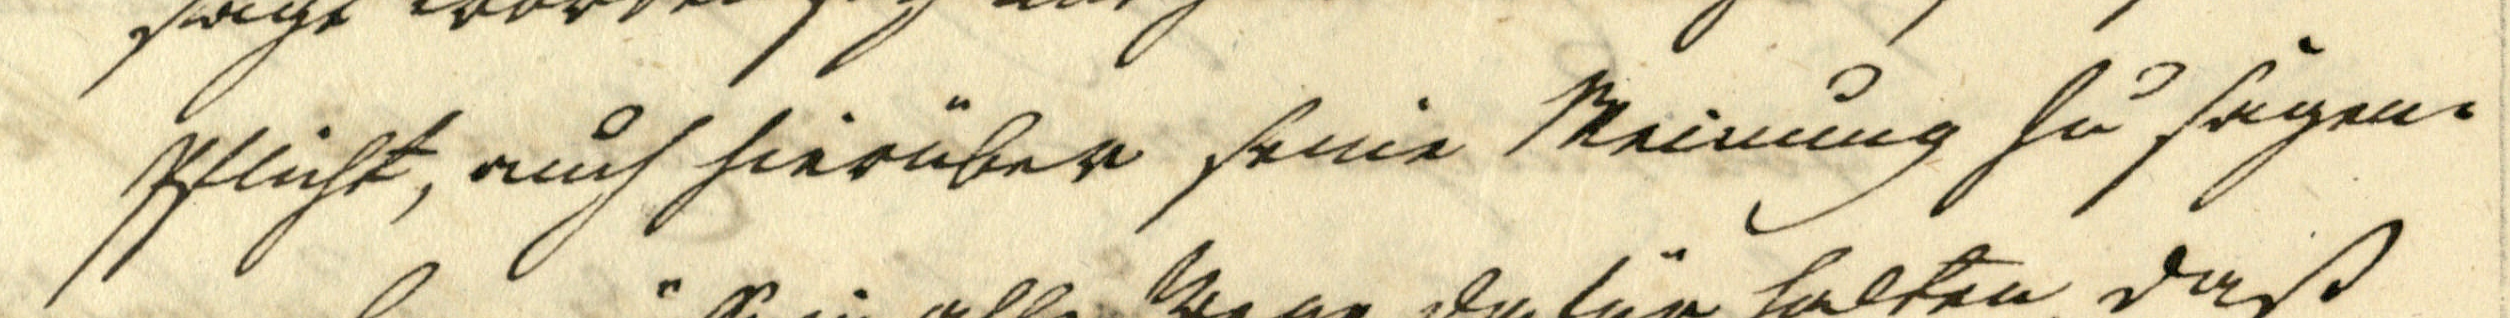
Pflicht, auch hierüber seine Meinung zu sagen.
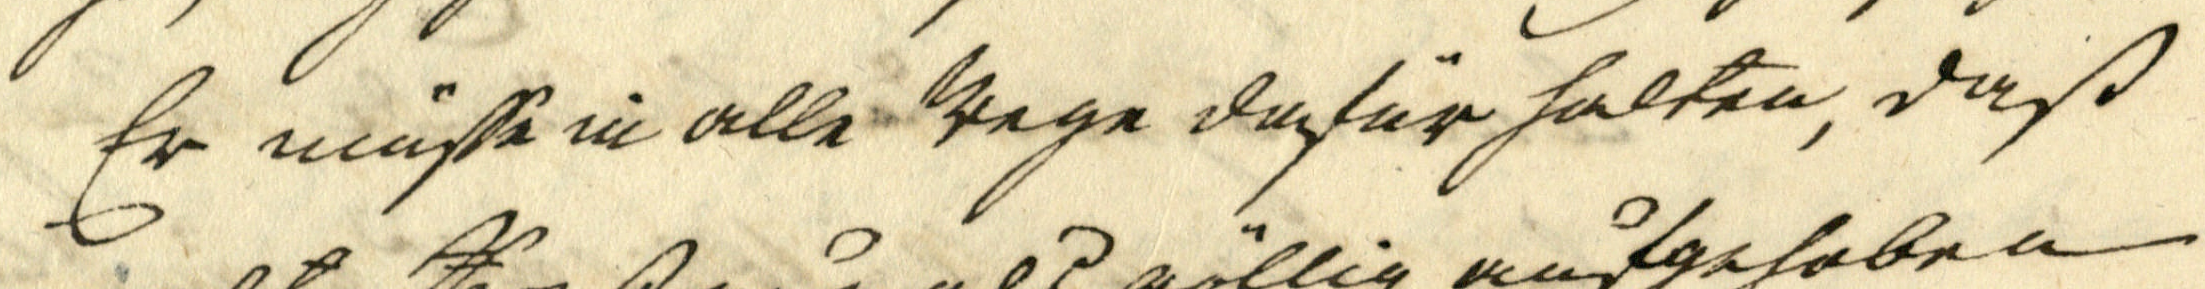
Er müsse in alle Wege dafür halten, daß
